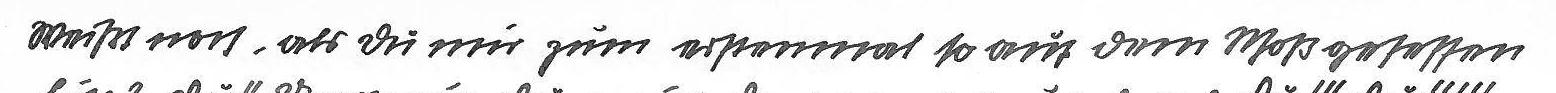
Weißt noch, als Du mir zum erstenmal auf dem Schoß gesessen
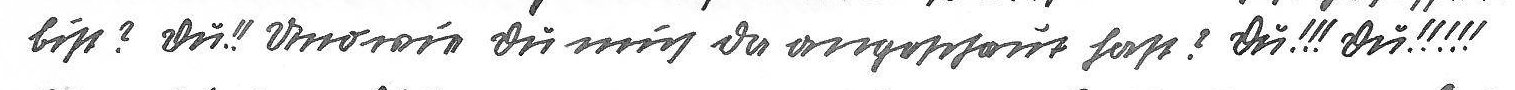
bist? Du!! Und wie Du mich da angeschaut hast? Du!!! Du!!!!!
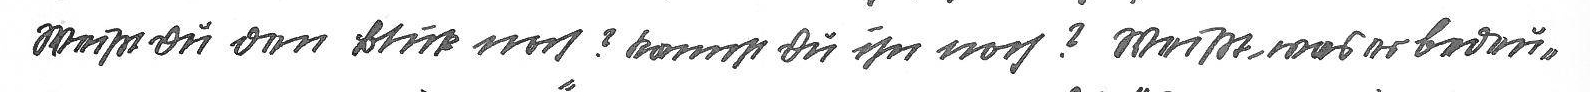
Weißt Du den Blick noch? Kannst Du ihn noch? Weißt, was er bedeu¬
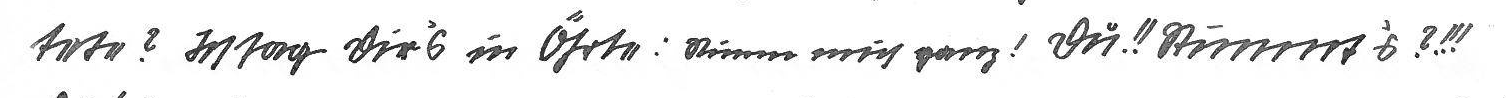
tete? Ich sag Dir’s ins Öhrle: Nimm mich ganz! Du!! Stimmt’s?!!!
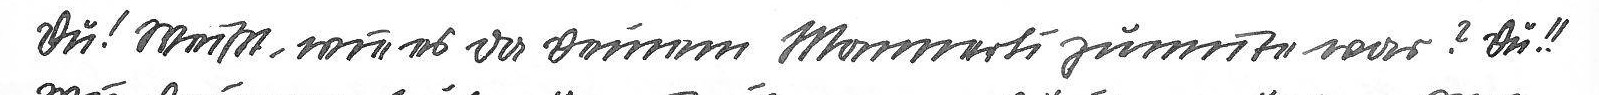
Du! Weißt, wie es da Deinem Mannerli zumute war? Du!!
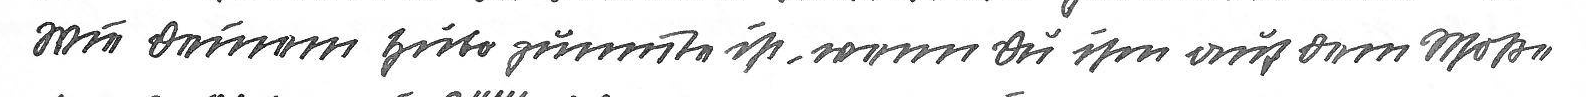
Wie Deinem Hubo zumute ist, wenn Du ihm auf dem Schoße
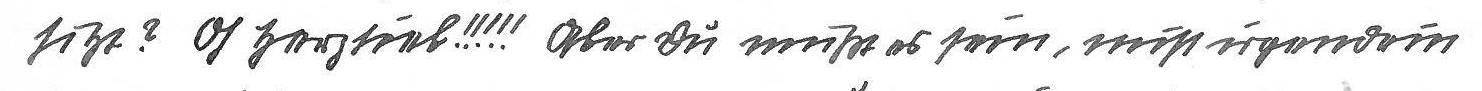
sitzt? Oh Herzlieb!!!!! Aber Du mußt es sein, nicht irgendein
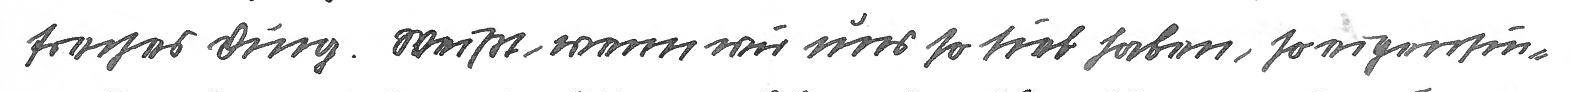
freches Ding. Weißt, wenn wir uns so lieb haben, so eigensin¬
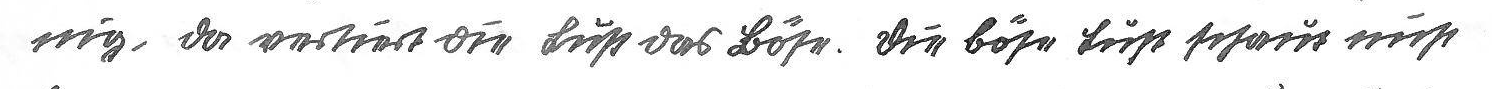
nig, da verliert die Lust das Böse. Die böse Lust schaut nicht
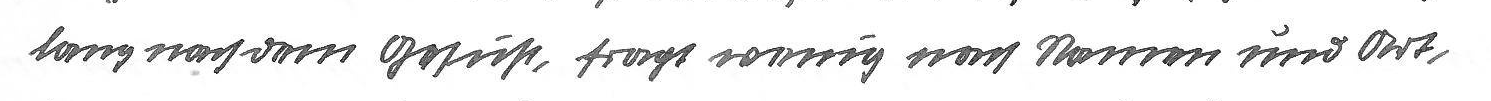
lang nach dem Gesicht, fragt wenig nach Namen und Ort,
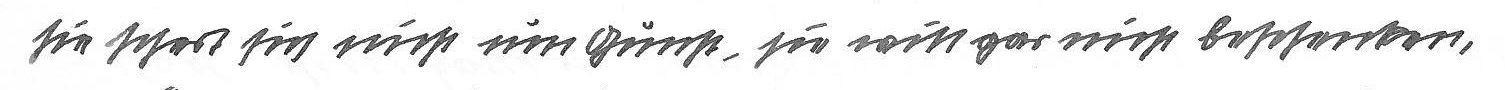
sie schert sich nicht um Gunst, sie will gar nicht beschenken,
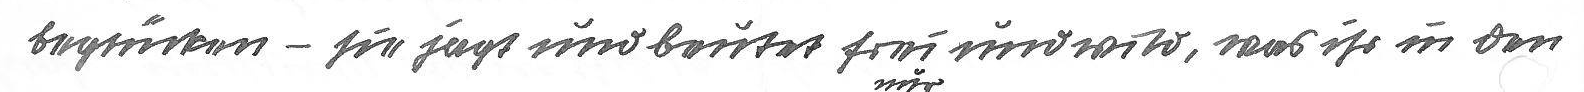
beglücken – sie jagt und beutet frei und wild, was ihr in den
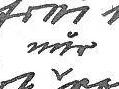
mir
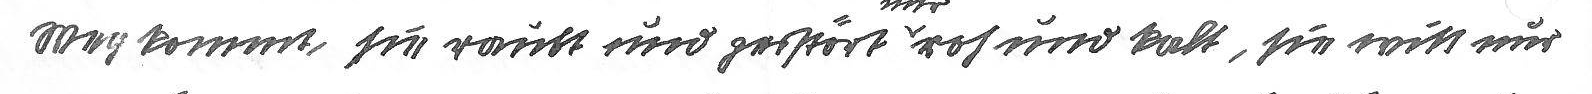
Weg kommt, sie raubt und zerstört roh und kalt, sie will nur
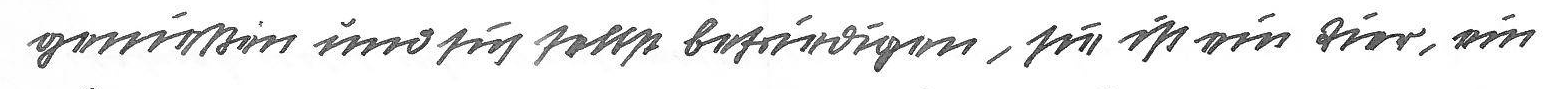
genießen und sich selbst befriedigen, sie ist ein Tier, ein
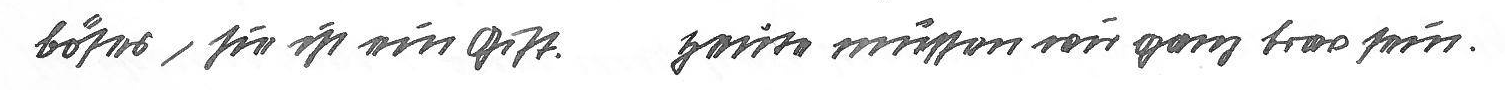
böses, sie ist ein Gift. Heute müssen wir ganz brav sein.
